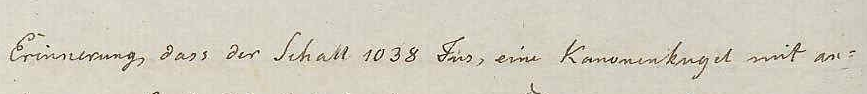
Erinnerung, dass der Schall 1038 Fus, eine Kanonenkugel mit an-
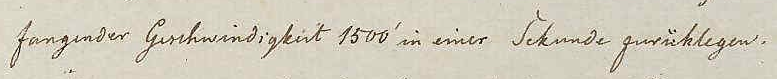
fangender Geschwindigkeit 1500′ in einer Sekunde zurüklegen.
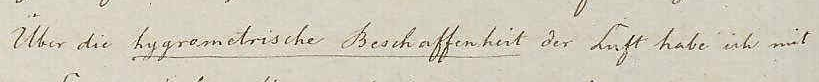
Über die hygrometrische Beschaffenheit der Luft habe ich mit
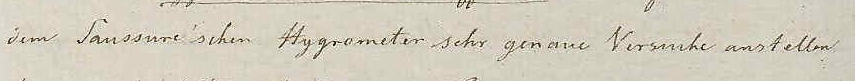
dem Saussure'schen Hygrometer sehr genaue Versuche anstellen
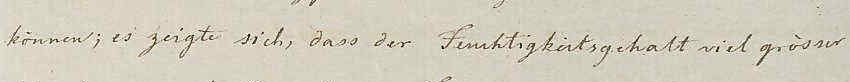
können; es zeigte sich, dass der Feuchtigkeitsgehalt viel grösser
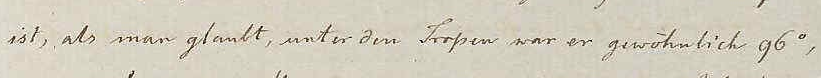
ist, als man glaubt, unter den Tropen war er gewöhnlich 96°,
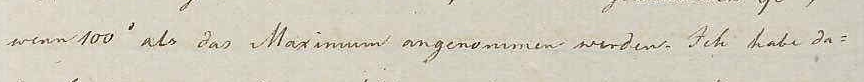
wenn 100° als das Maximum angenommen werden. Ich habe da-
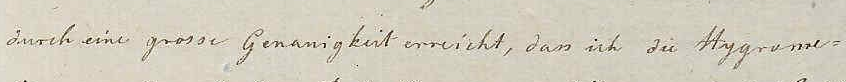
durch eine grosse Genauigkeit erreicht, dass ich die Hygrome-
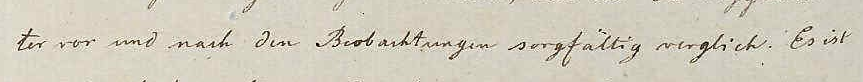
ter vor und nach den Beobachtungen sorgfältig verglich. Es ist
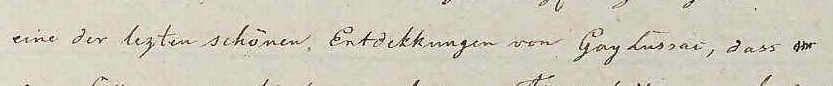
eine der lezten schönen Entdekkungen von Gay Lussac, dass er
